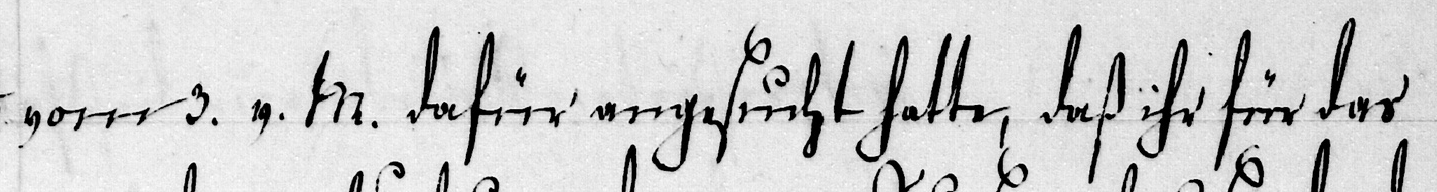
vom 3. v. M. dafür angesucht hatte, daß ihr für das
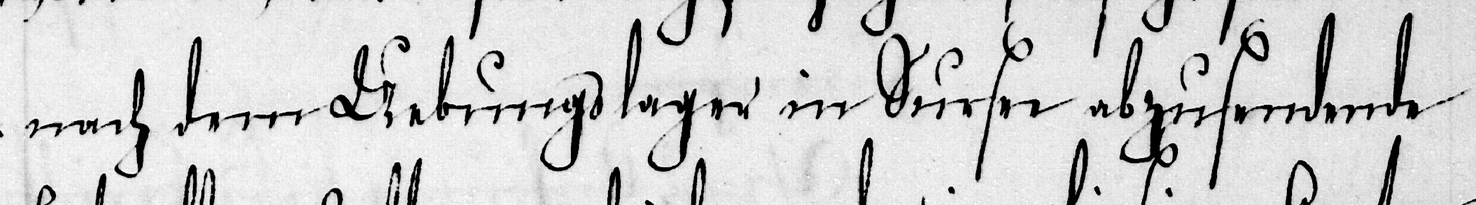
nach dem Uebungslager in Sursee abzusendende
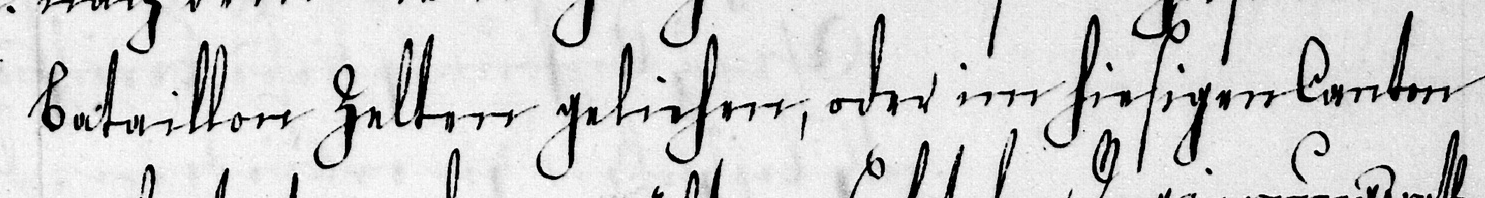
Bataillon Zelten geliehen, oder im hiesigen Canton
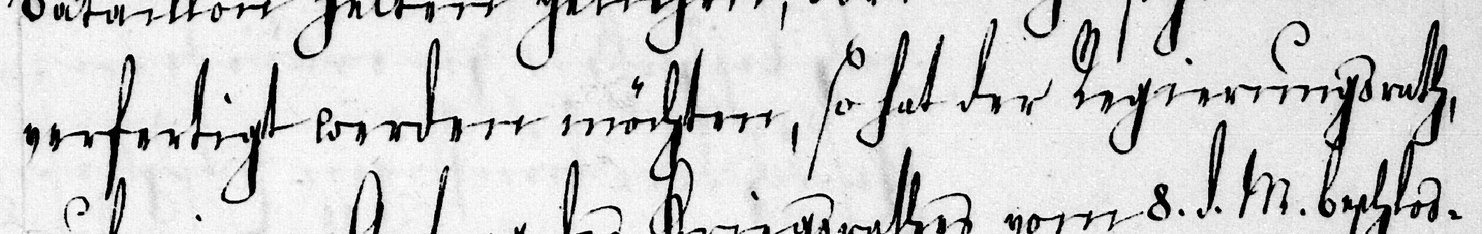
verfertigt werden möchten, so hat der Regierungsrath,
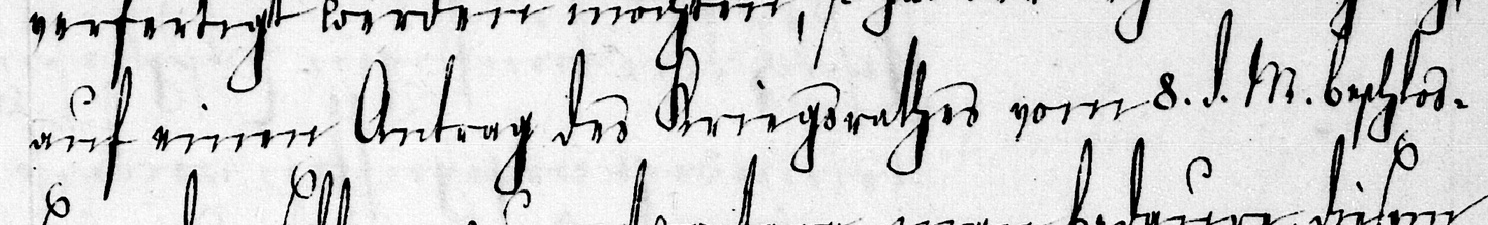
auf einen Antrag des Kriegsrathes vom 8. d. M. beschloß¬
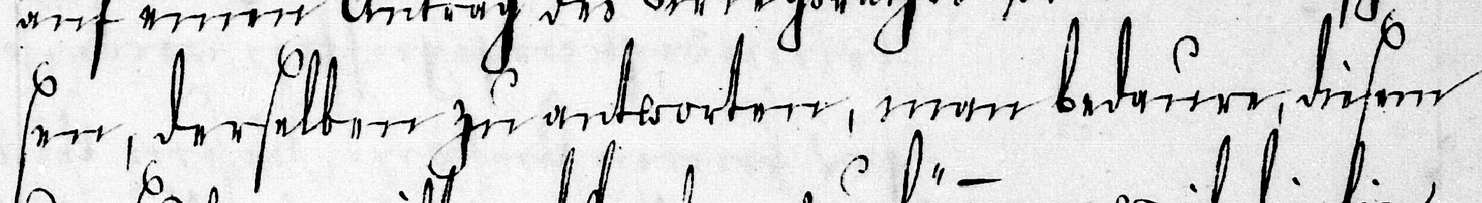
en, derselben zu antworten, man bedaure, diesem
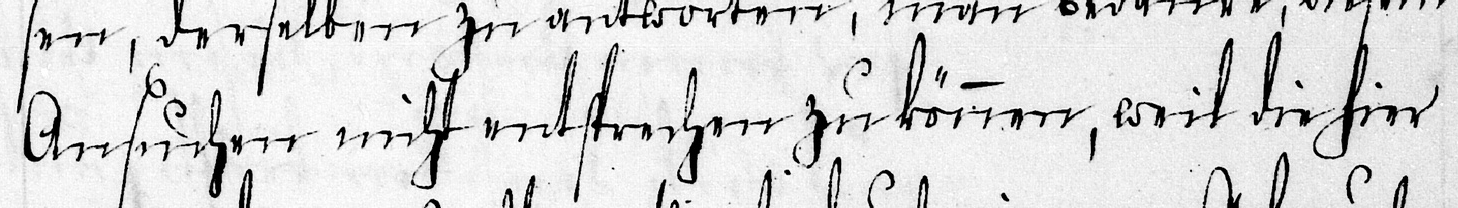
Ansuchen nicht entsprechen zu können, weil die hier
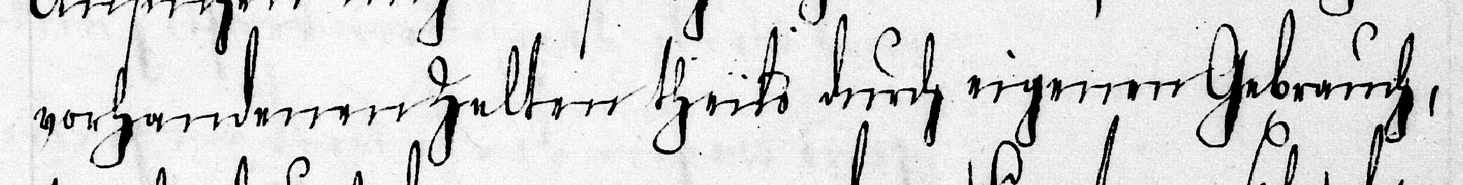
vorhandenen Zelten theils durch eigenen Gebrauch,
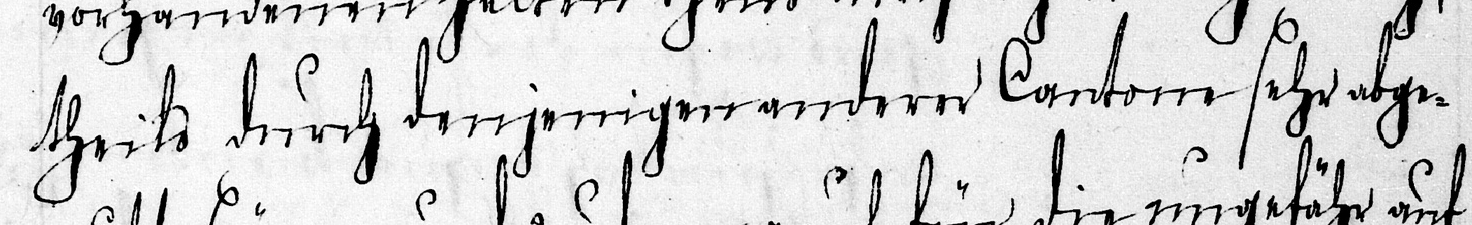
theils durch denjenigen anderer Cantone sehr abge¬
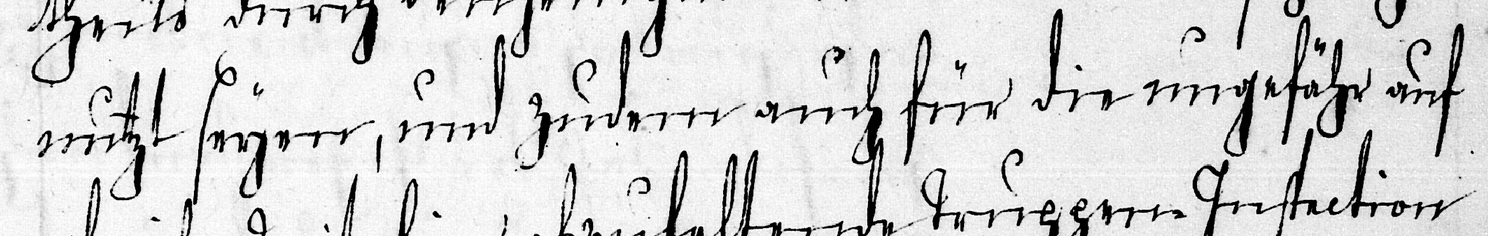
nutzt seyen, und zudem auch für die ungefähr auf
